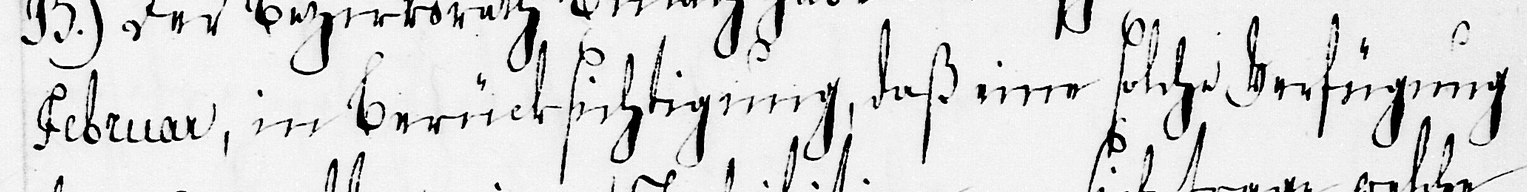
Februar, in Berücksichtigung, daß eine solche Verfügung
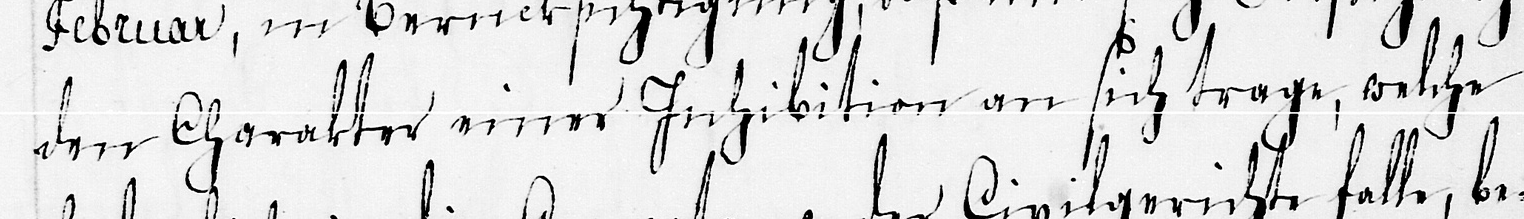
den Charakter einer Inhibition an sich trage, welche
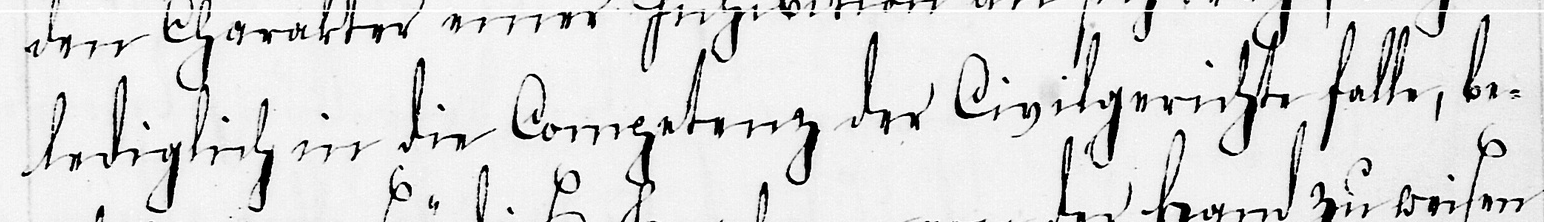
lediglich in die Competenz der Civilgerichte falle, be¬
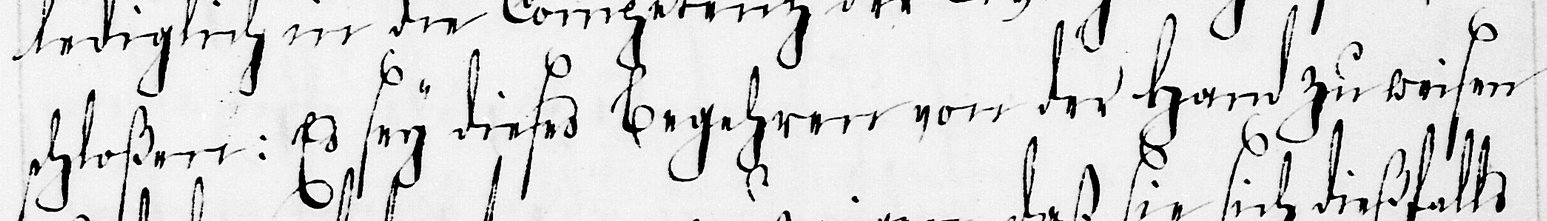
schloßen: Es sey dieses Begehren von der Hand zu weisen
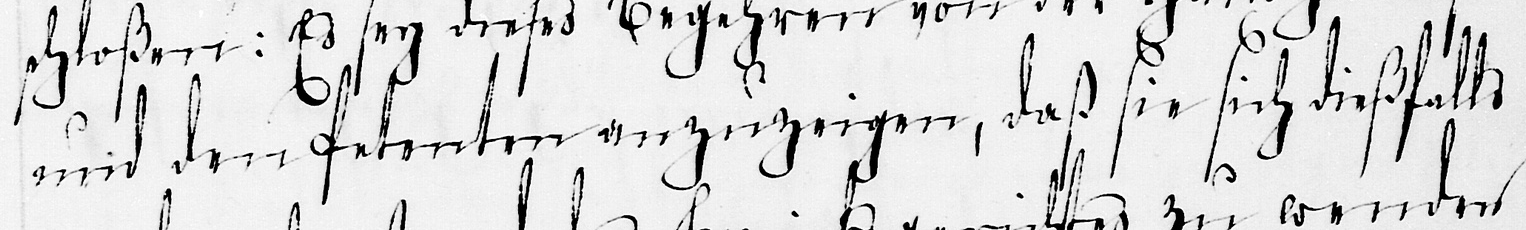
und den Petenten anzuzeigen, daß sie sich dießfalls
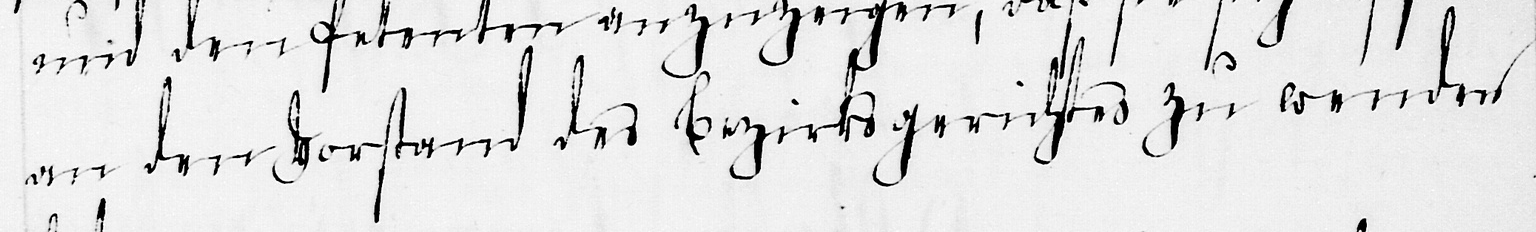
an den Vorstand des Bezirksgerichtes zu wenden
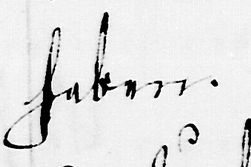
haben.
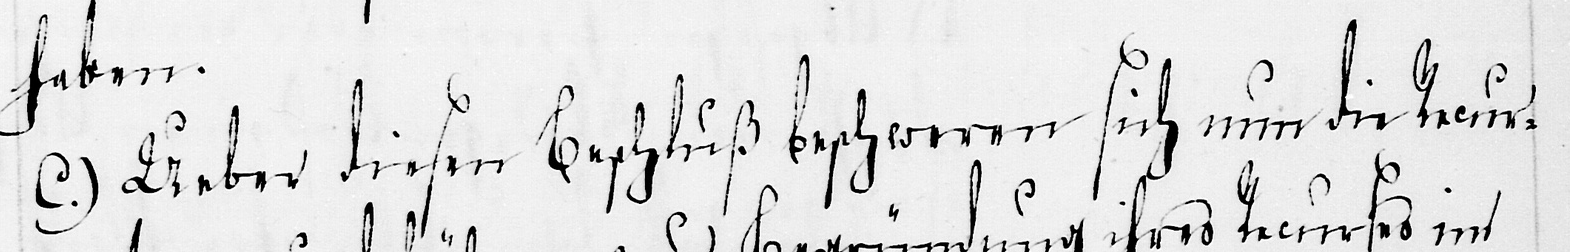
C.) Ueber diesen Beschluß beschweren sich nun die Recur¬
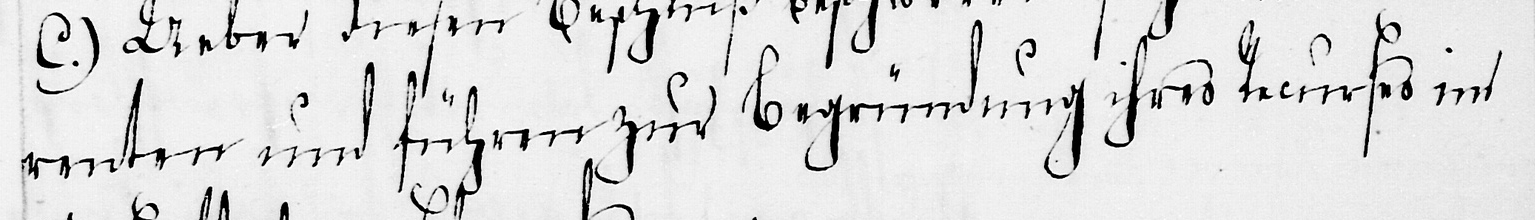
renten und führen zur Begründung ihres Recurses im
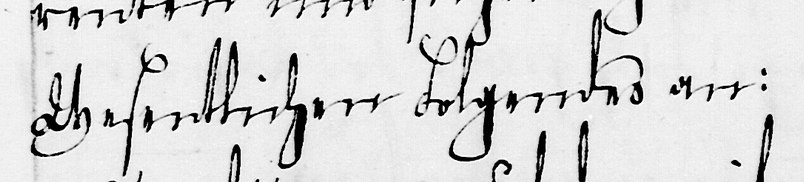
Wesentlichen Folgendes an:
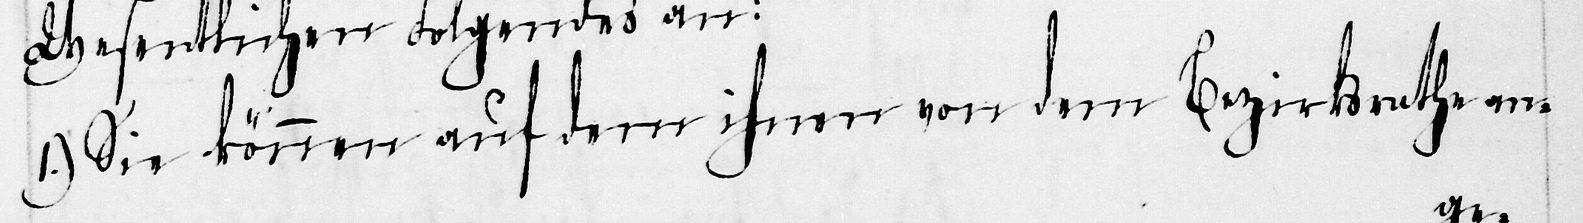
1.) Sie können auf dem ihnen von dem Bezirksrathe an-
